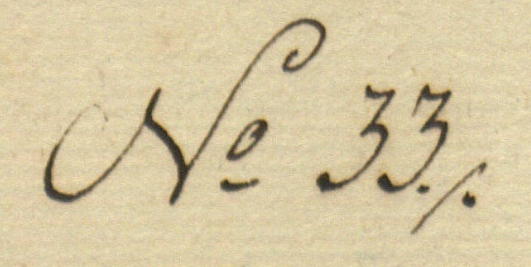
No 33.
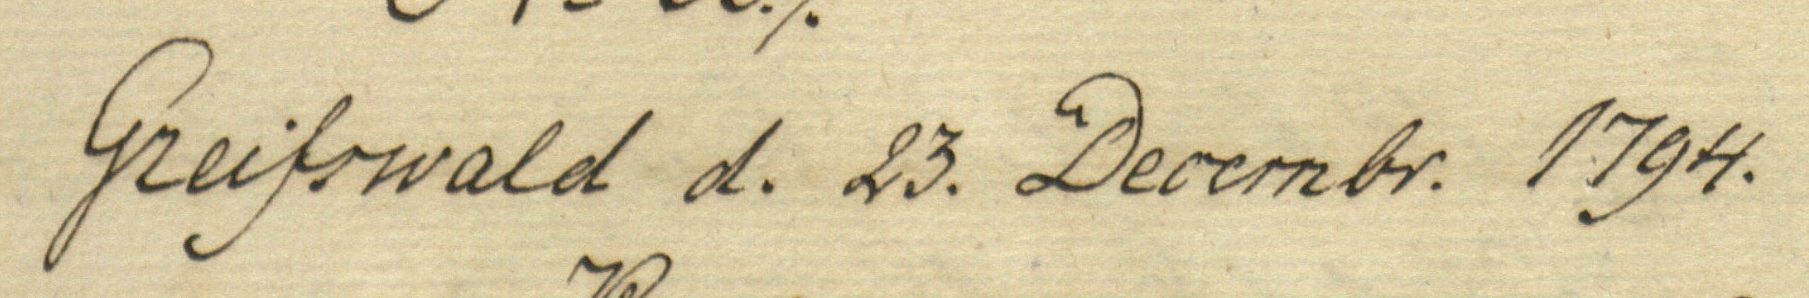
Greifswald d. 23. Decembr. 1794.
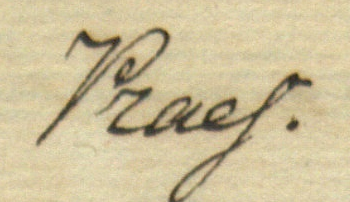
Praes.
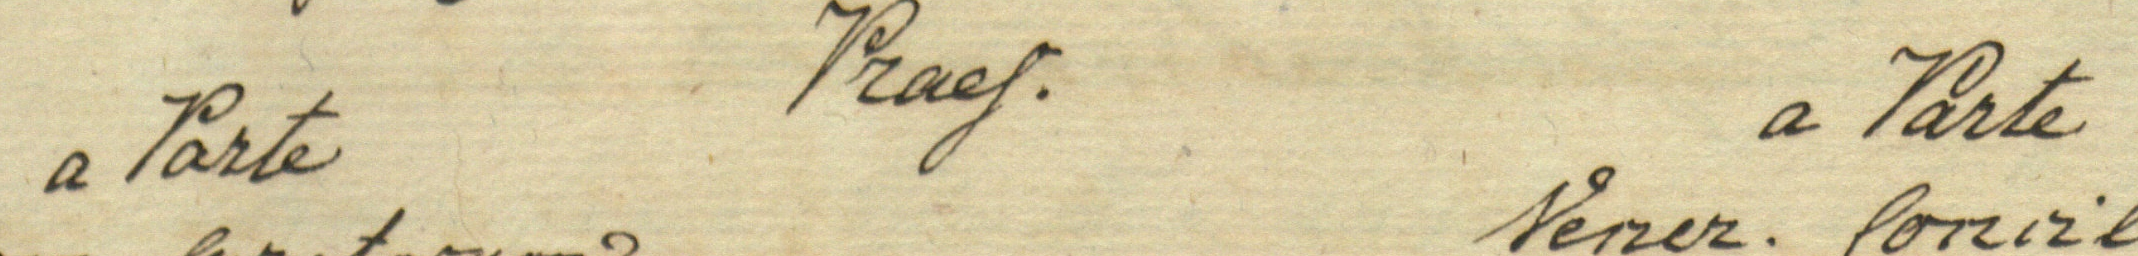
a Parte a Parte
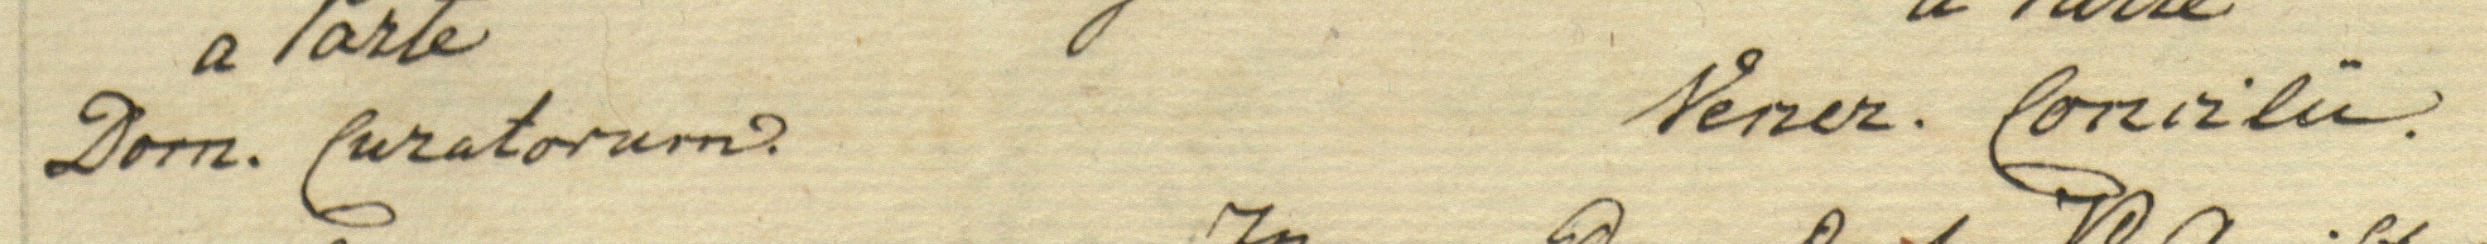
Dom. Curatorum. Vener. Concilii.
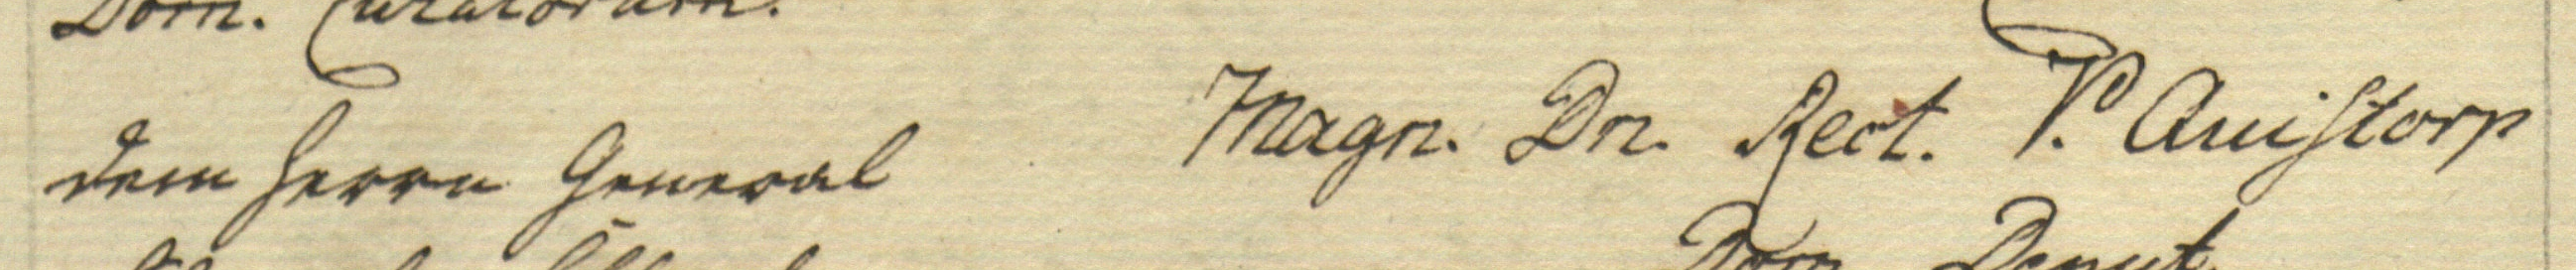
dem Herrn General¬ Magn. Dn. Rect. P. Quistorp
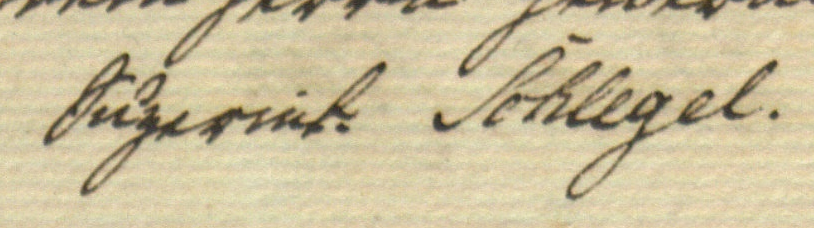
Superint. Schlegel.
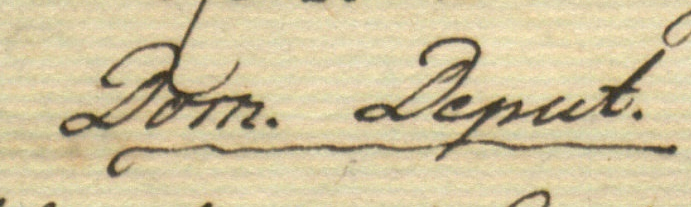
Dom. Deput.
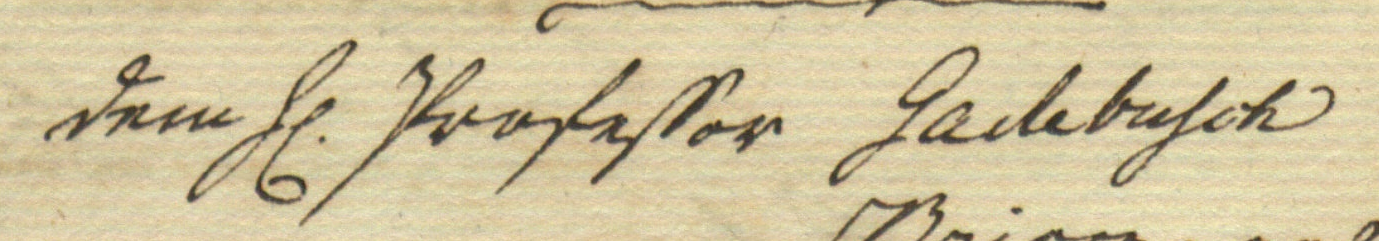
dem dh. Professor Gadebusch
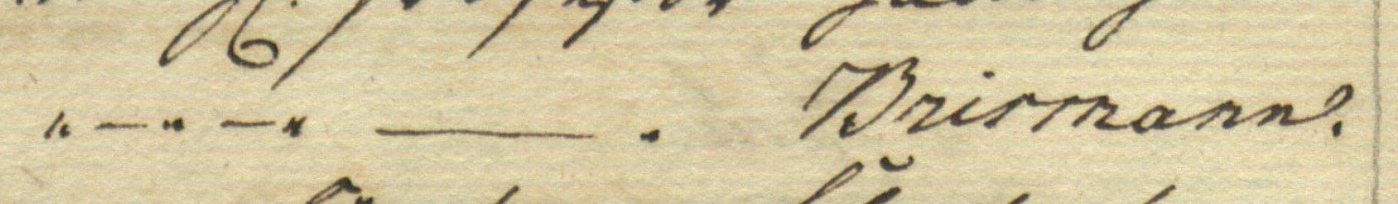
Brismann.
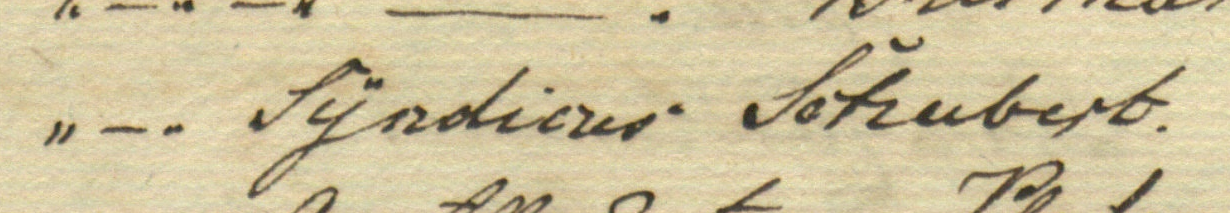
Sÿndicus Schubert.
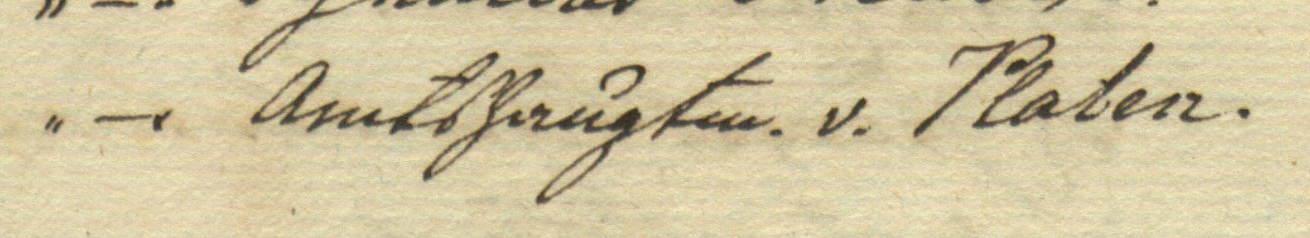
Amtshauptm. v. Platen.
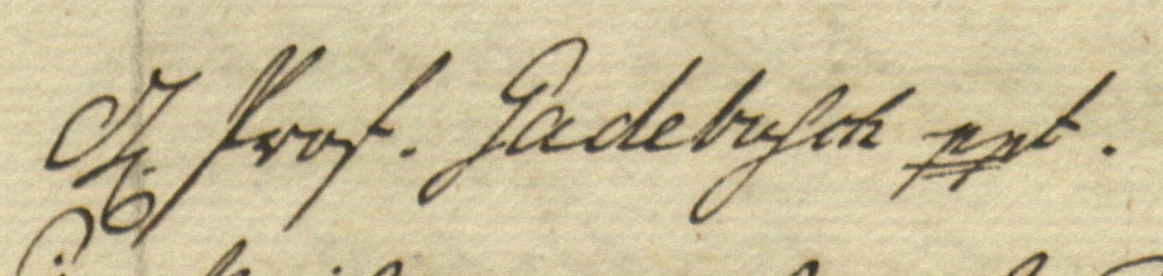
dh. Prof. Gadebusch ppt.
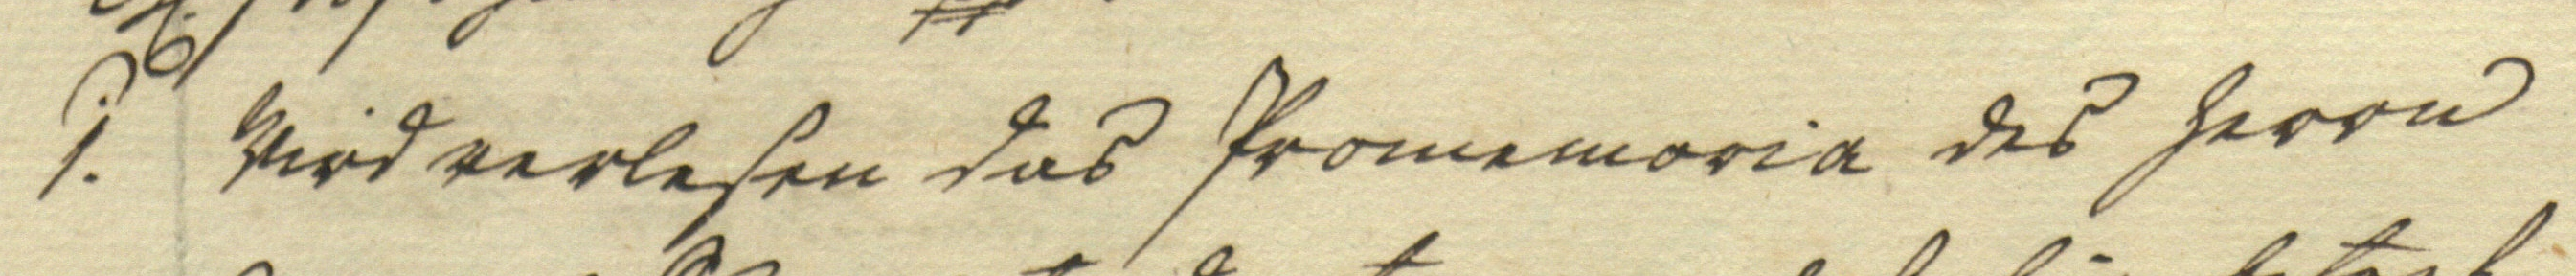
1. Wird verlesen das Promemoria des Herrn
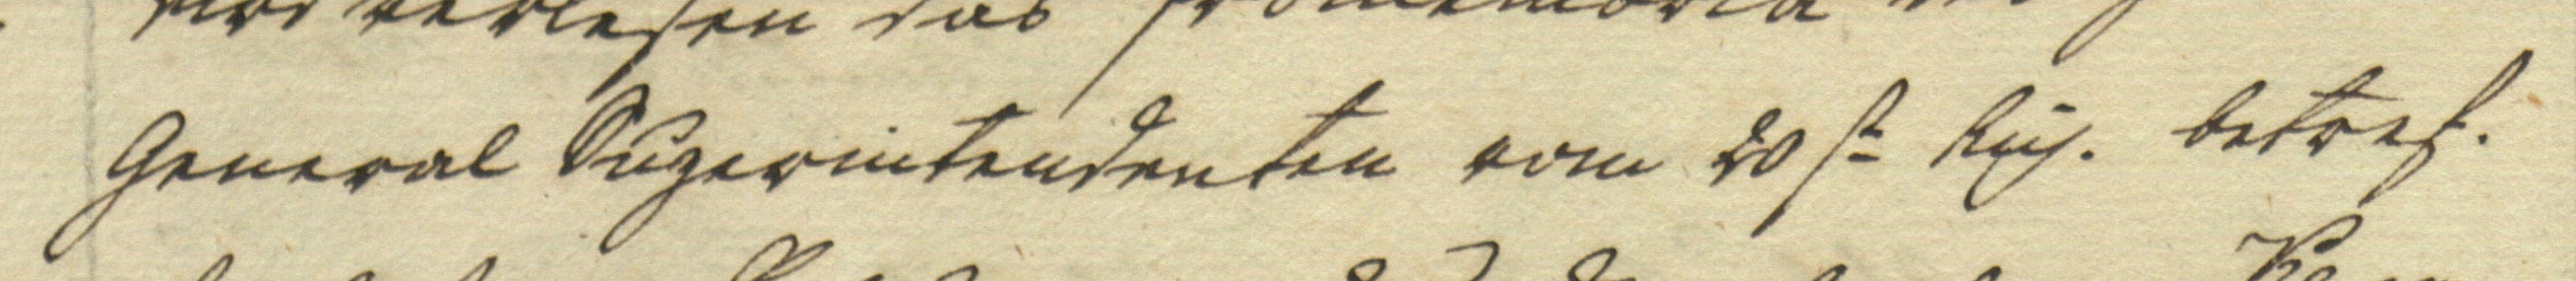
General Superintendenten vom 20 st huj. betref¬
